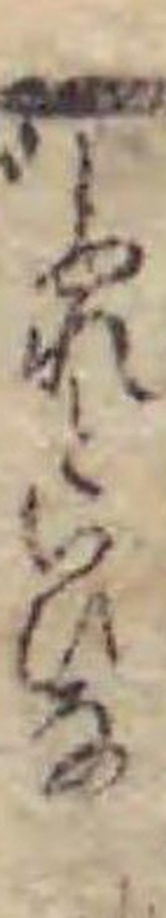しやれといひな
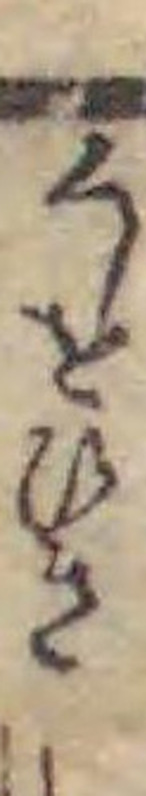くしをひき

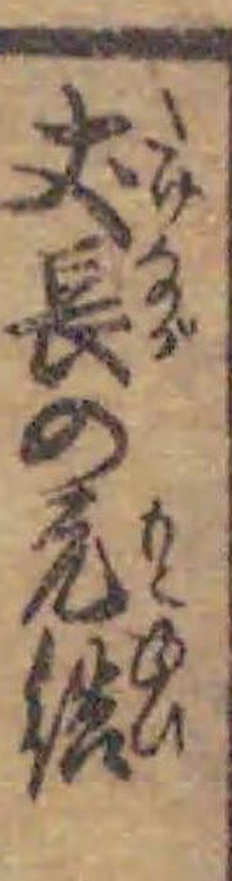丈長の元結
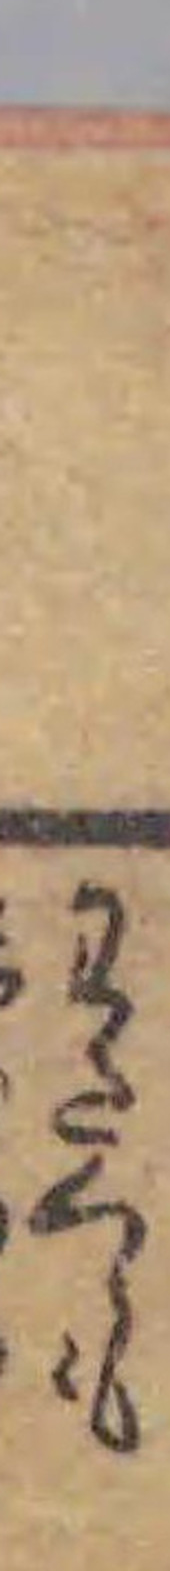わたくしも
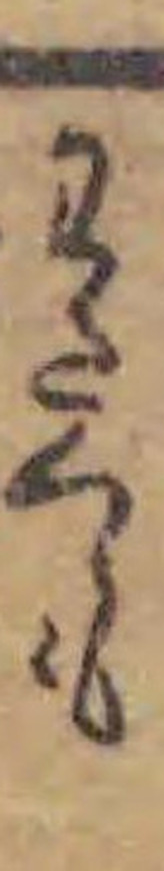わたくしも
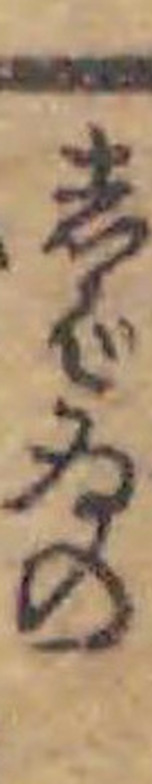しばゐの
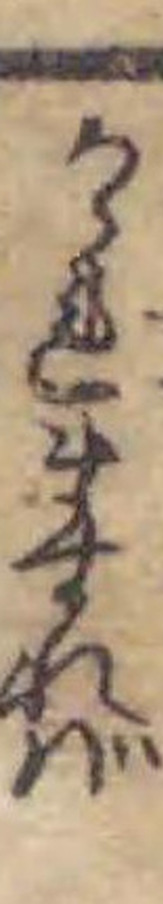かゝれますれば
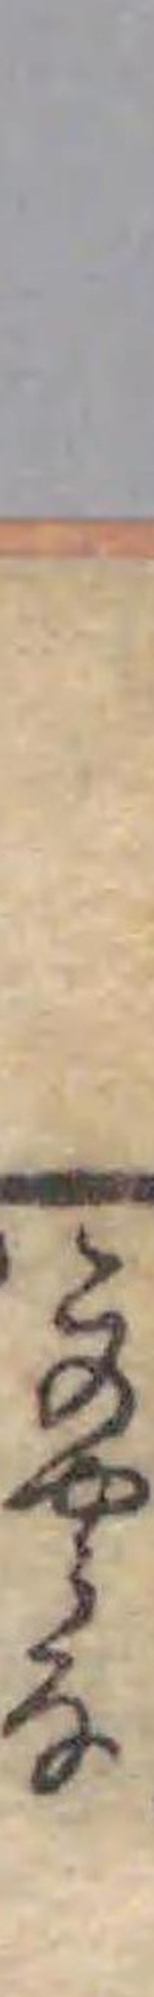このやうな
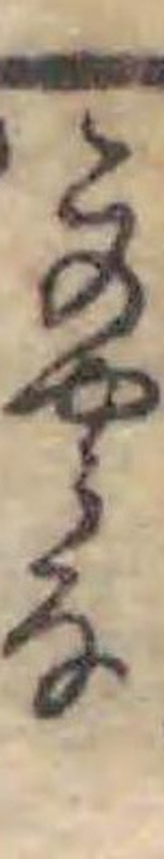このやうな
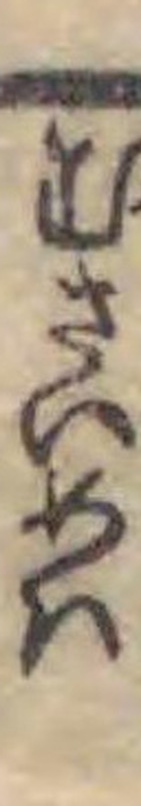むさいめは
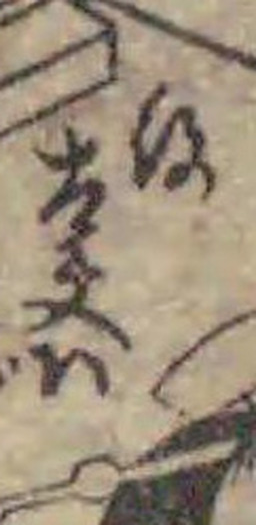太夫は
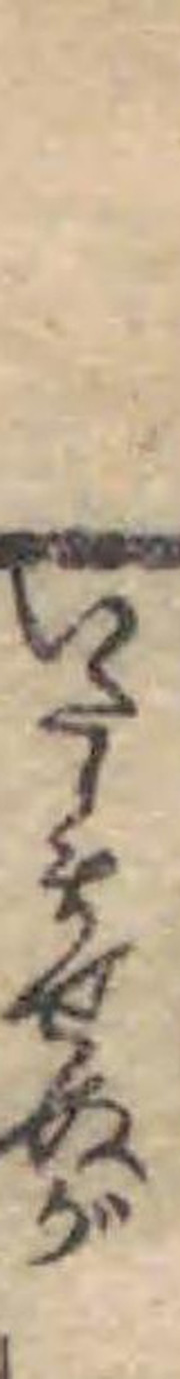いたしませぬが
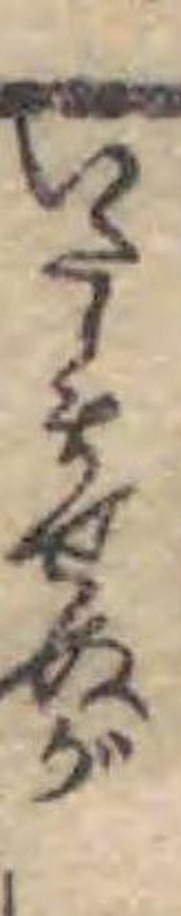いたしませぬが
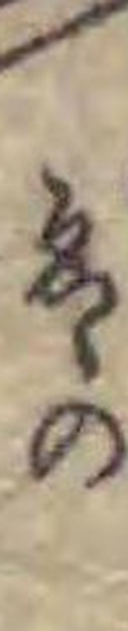ゑゝの
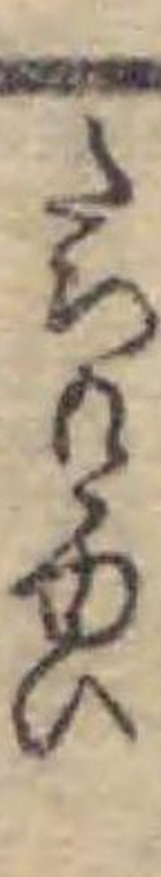たちもとゆひ
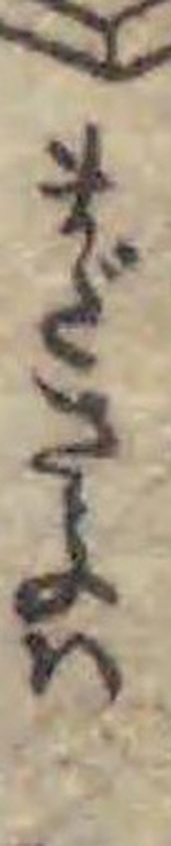まださよは
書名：紙屑身上噺 : 3巻
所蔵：国立国会図書館 National Diet Library, JAPAN
